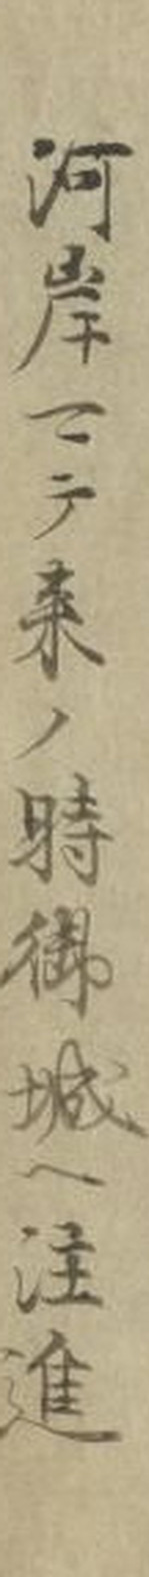河岸マテ来ノ時御城へ注進
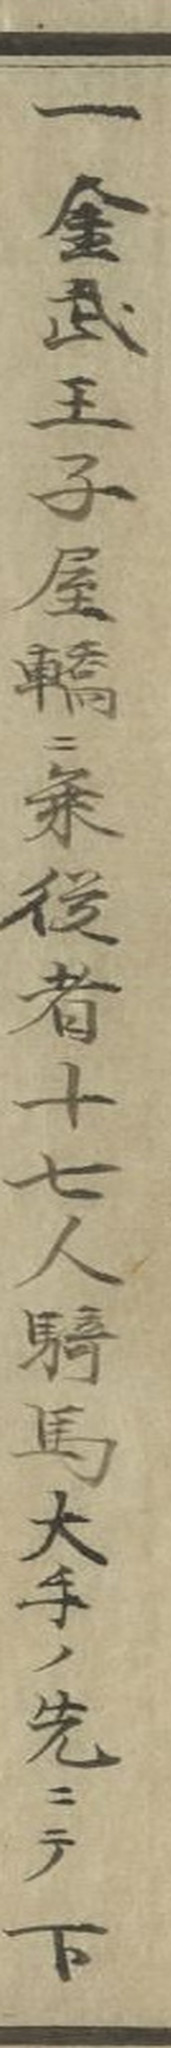一金武王子屋轎ニ乗従者十七人騎馬大手ノ先ニテ下
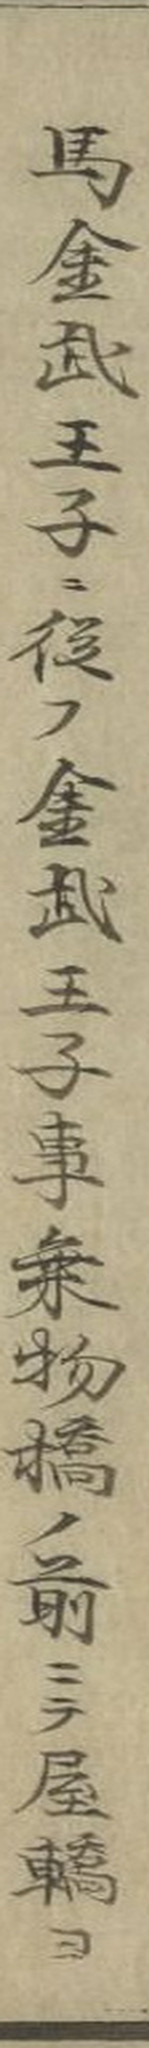馬金武王子ニ従フ金武王子事乗物橋ノ前ニテ屋轎ヨ
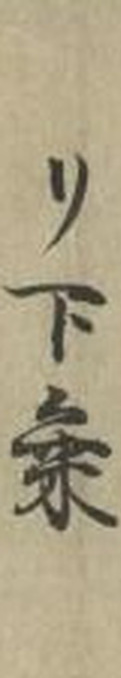ㇼ下乗
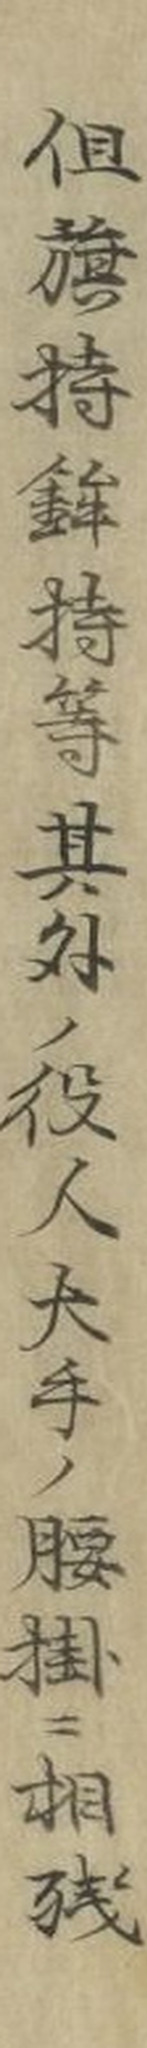但旗持鉾持等其外ノ役人大手ノ腰掛ニ相残
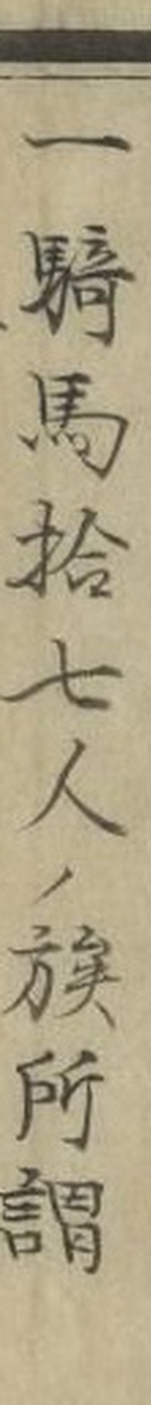一騎馬拾七人ノ族所謂
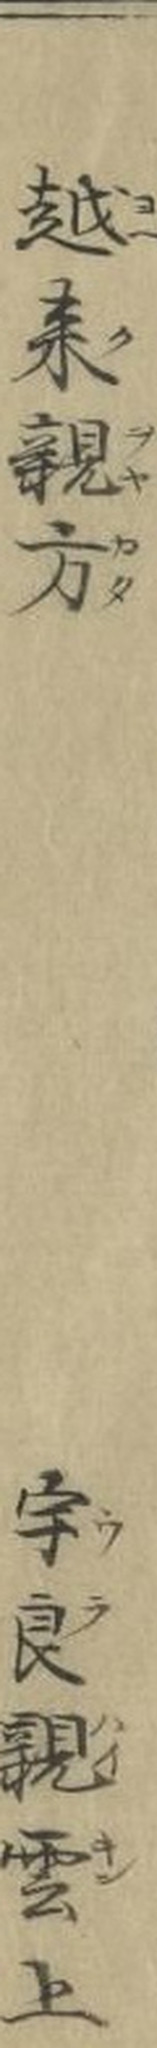越来親方宇良親雲上
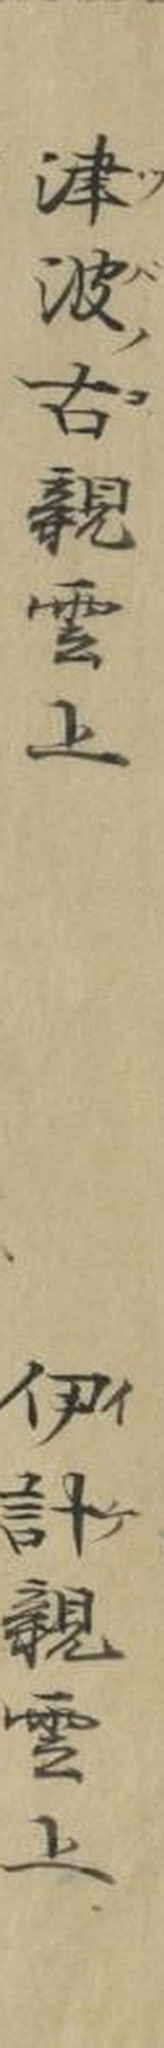津波古親雲上伊計親雲上
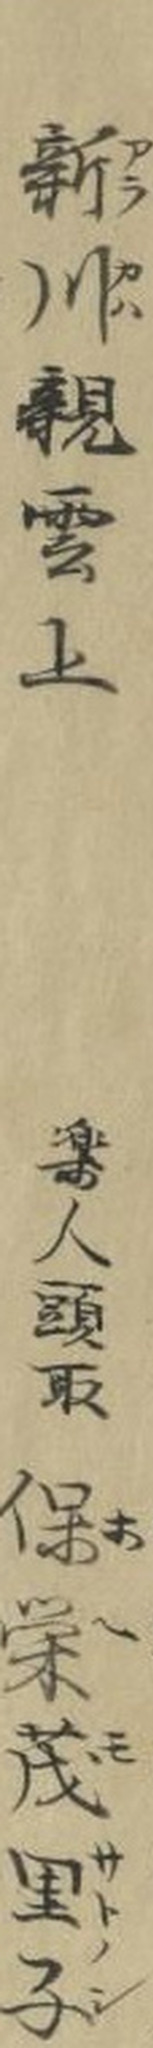新川親雲上楽人頭取保栄茂里子
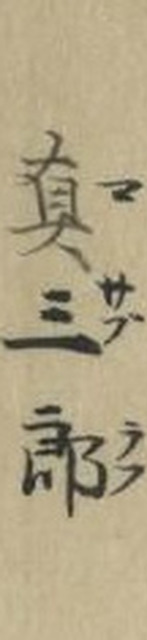真三郎
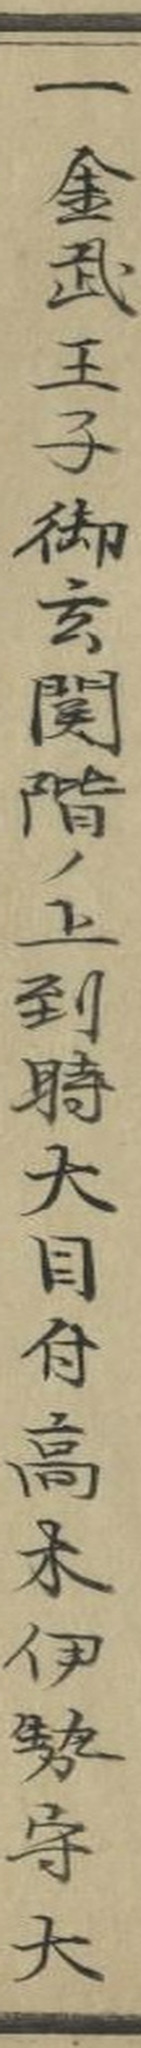一金武王子御玄関階ノ上到時大目付高木伊勢守大
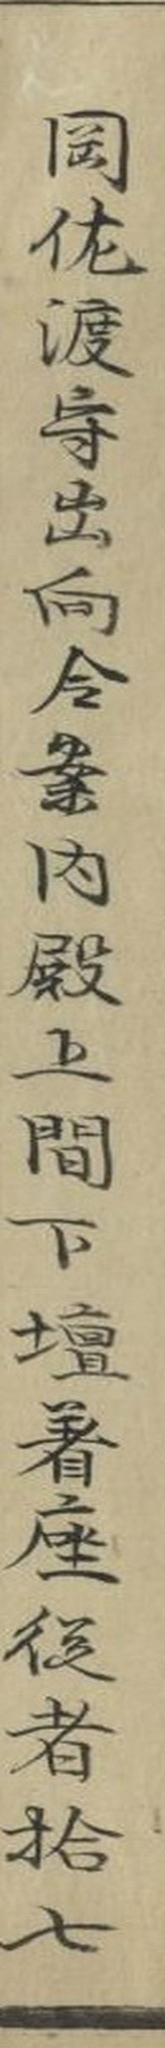岡佐渡守出向令案内殿上間下檀着座従者拾七
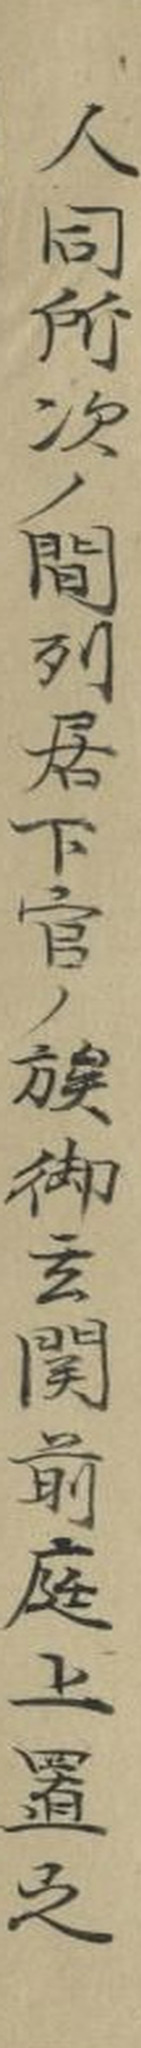人同所次ノ間列居下官ノ族御玄関前庭上置之

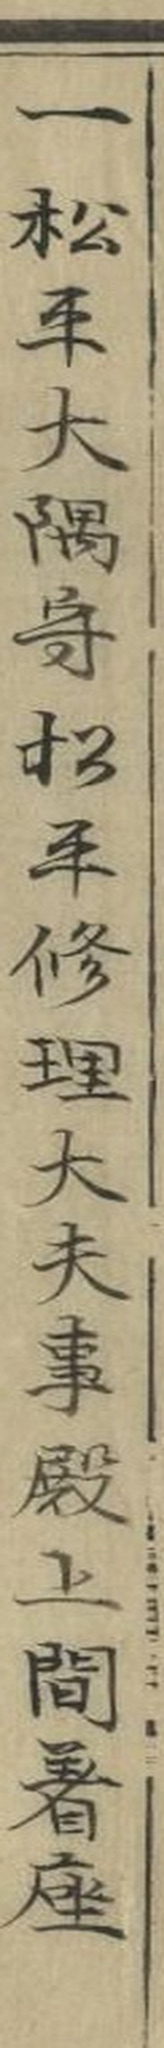一松平大隅守松平修理大夫事殿上間着座
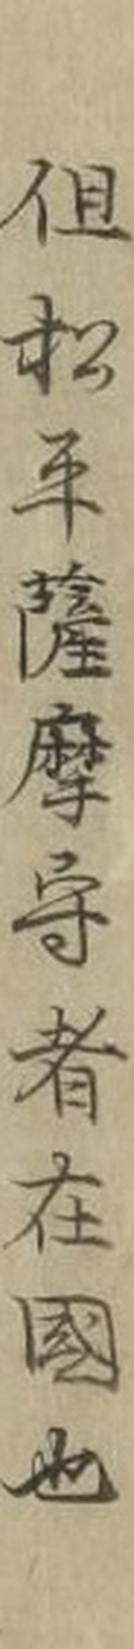但松平薩摩守者在国也
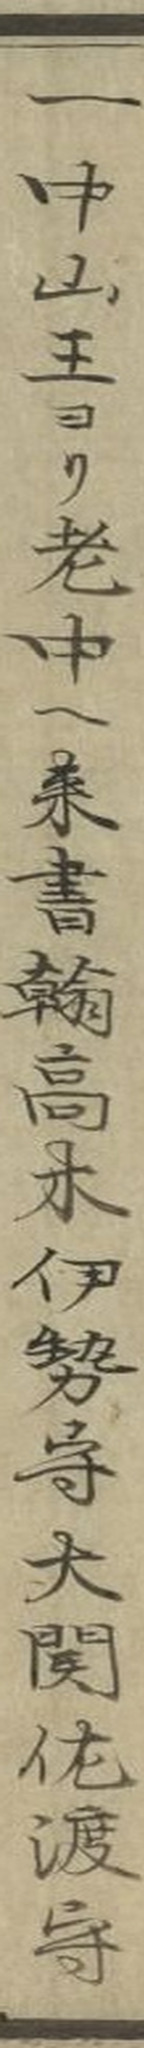一中山王ョㇼ老中へ来書翰高木伊勢守大関佐渡守
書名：琉球往来（下）
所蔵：University of the Ryukyus Library
